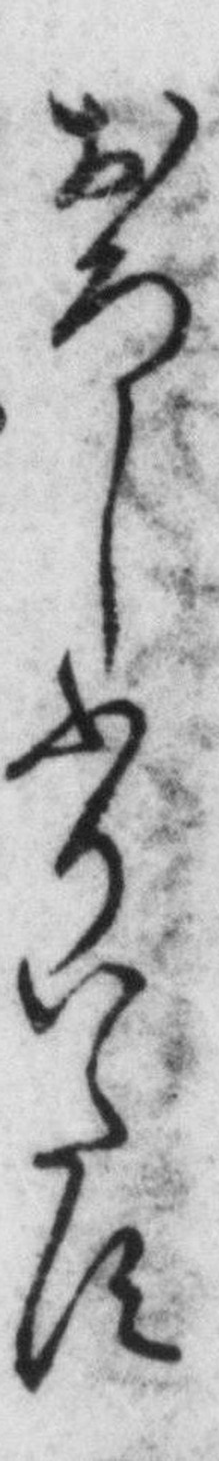おろしふりいたす
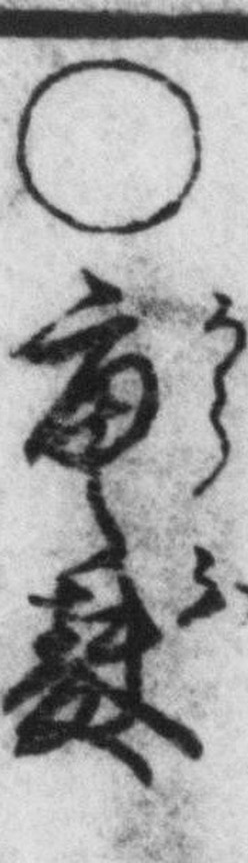〇唐麩
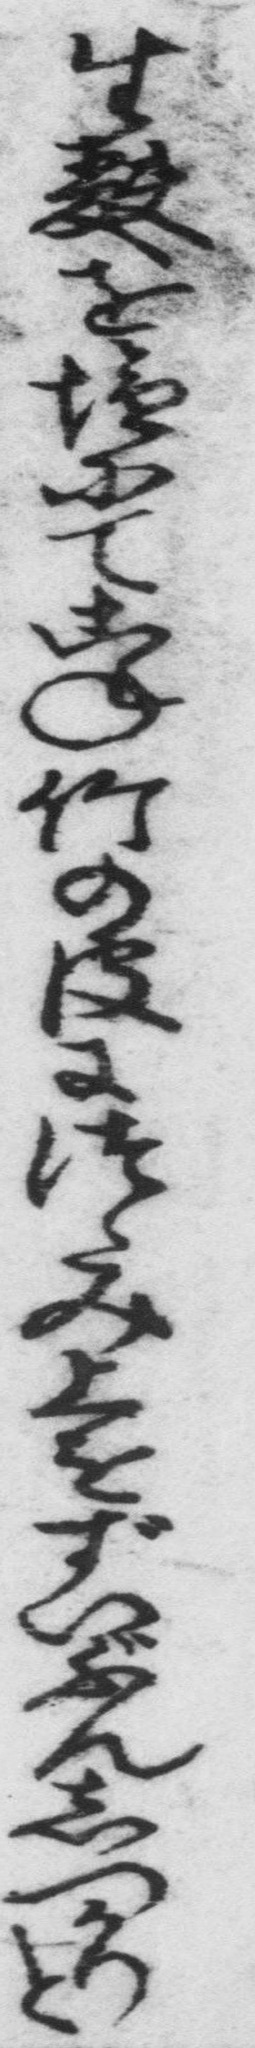生麩を塩にてこね竹の皮につゝみ上をずいぶんしつかりと
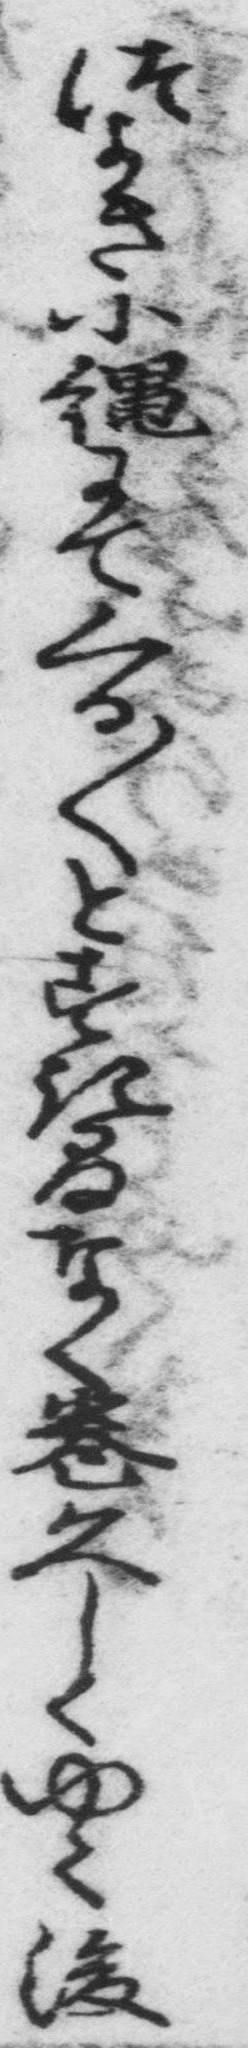つよき小縄にてくる〳〵とすき間なく巻久しくゆて後
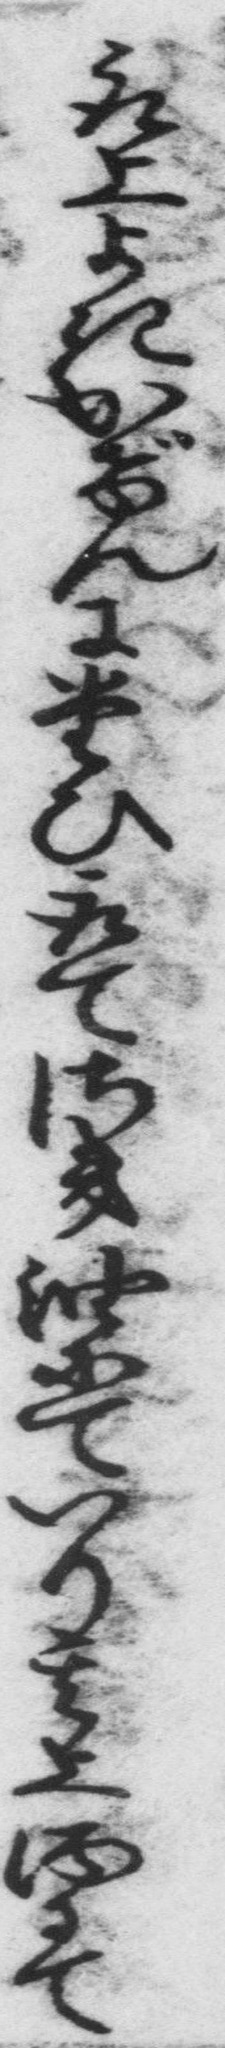取上よきかげんにひ取てさき油にていり其上酒にて
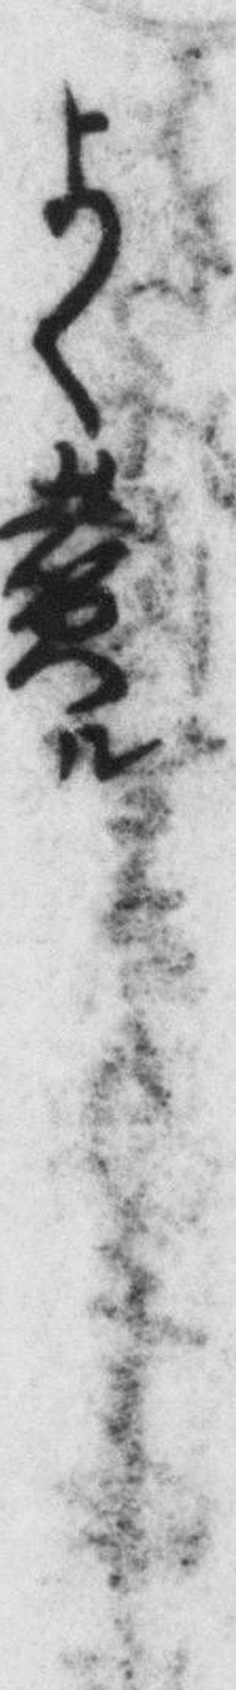よく煮る
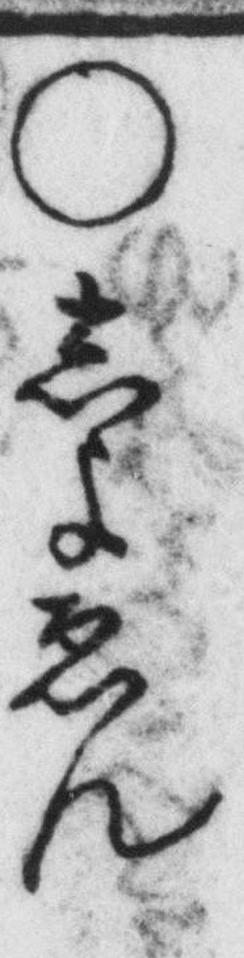〇しよゑん
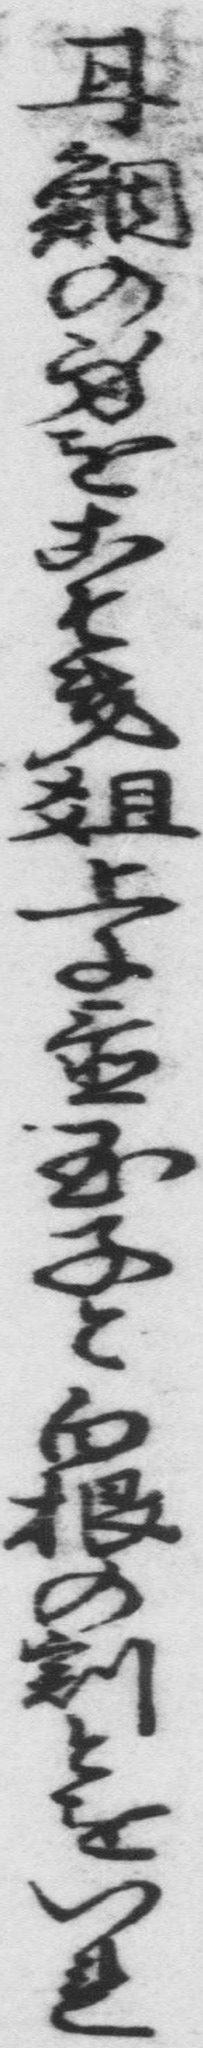甘鯛の身をこそき俎板上に置玉子と白根の割とをいれ
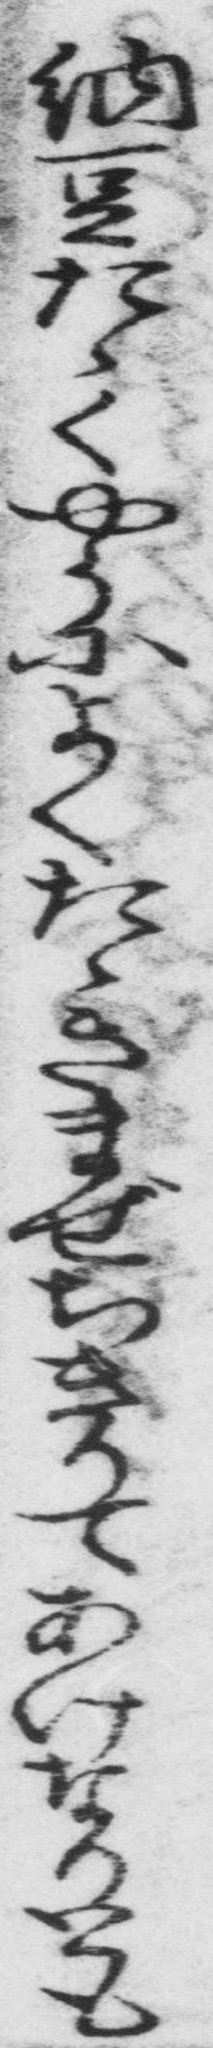納豆たゝくやうによくたゝきまぜちきりてあけなりとも
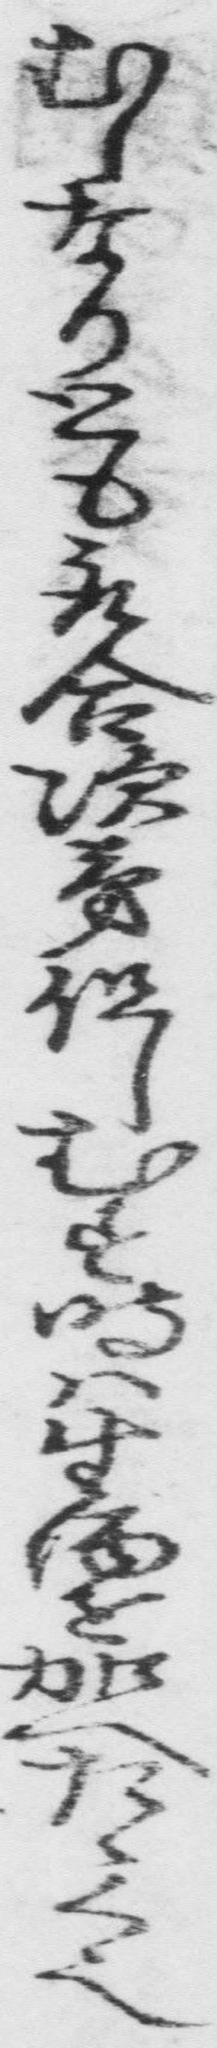むしなりとも取合次第但しむす時は生酒を加へたゝく也
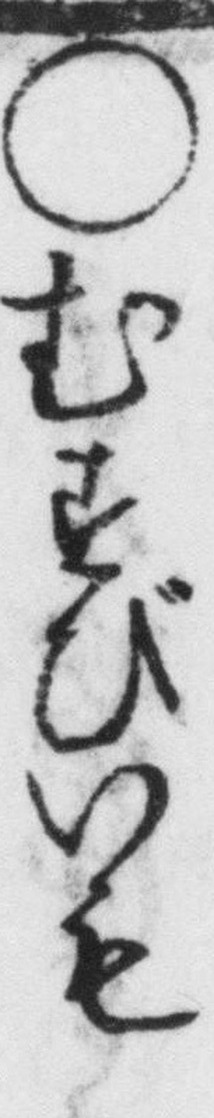〇むすびいも
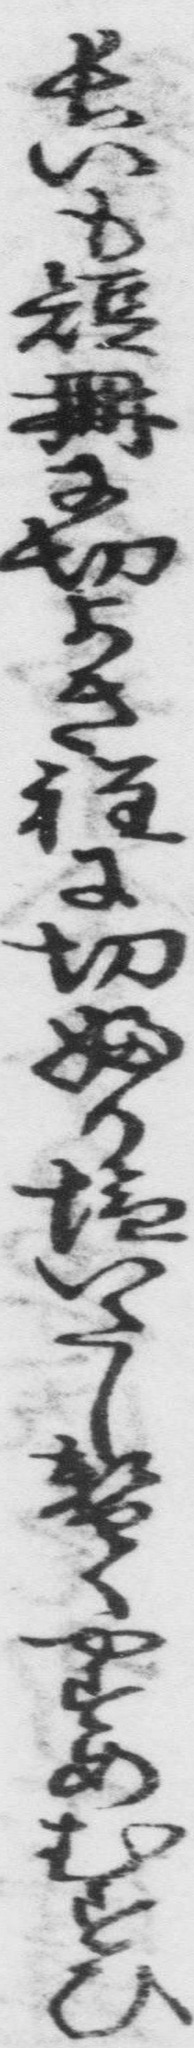長いも短冊に切よき程に切ふり塩いたし暫くやすめむすひ
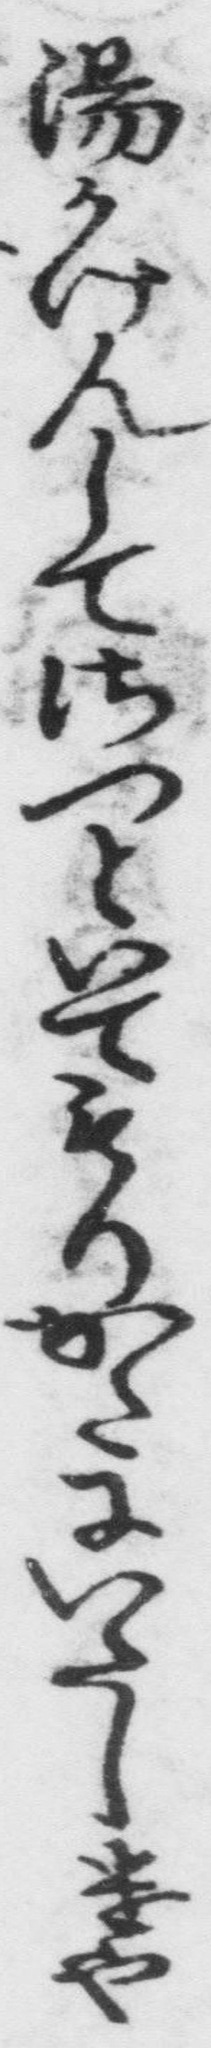湯かけんしてさつといてもりかたにいたし遣也
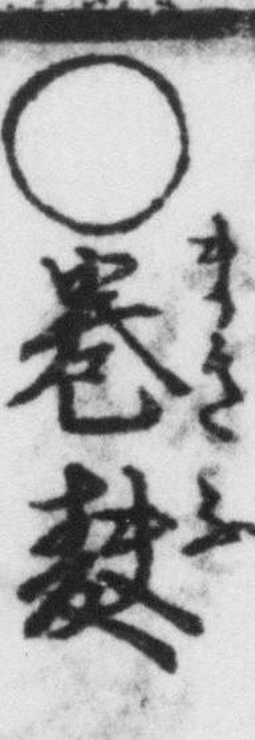〇巻麩
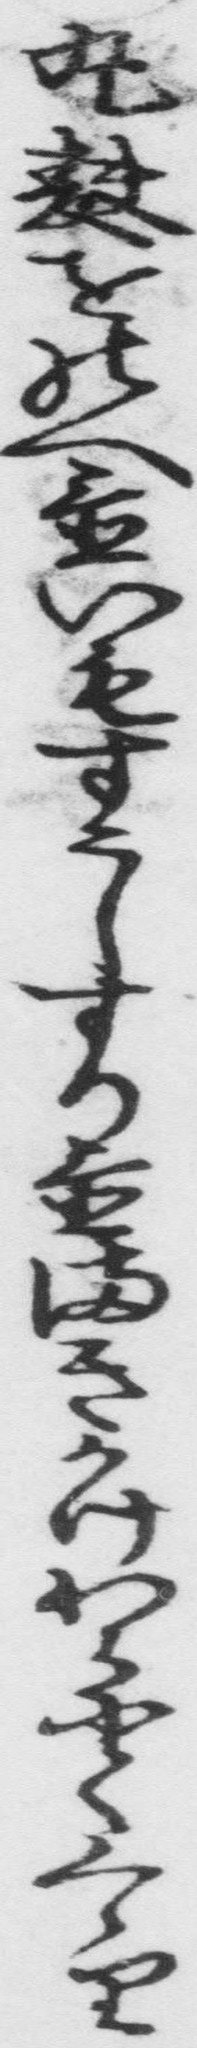丸麩をのへ置いもすこしすり置まきかけわらにてくゝり
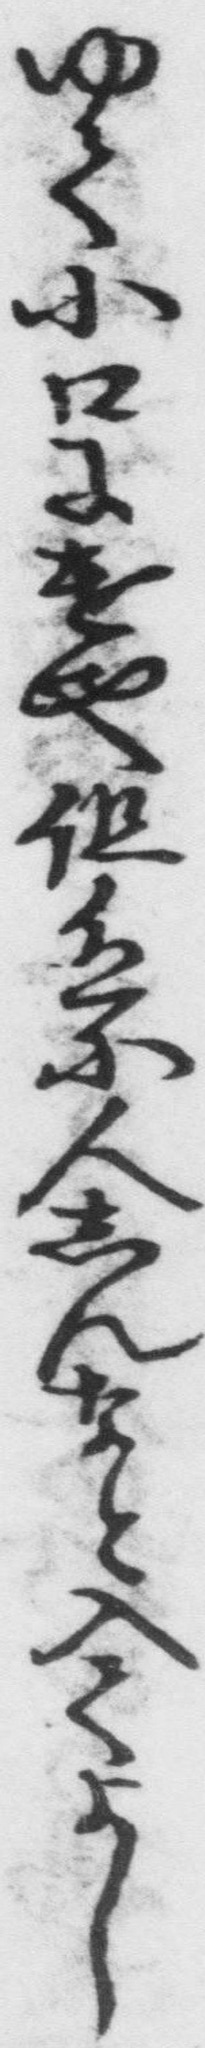ゆて小口に遣也但色にんしんなと入てよし
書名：卓子料理仕様
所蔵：大阪府立大学学術情報センター 国文学研究資料館
